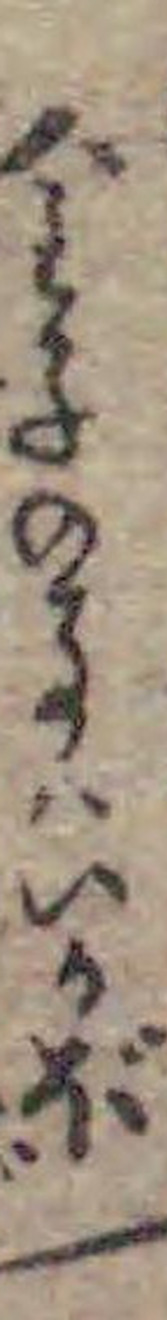金子の事はいかほ
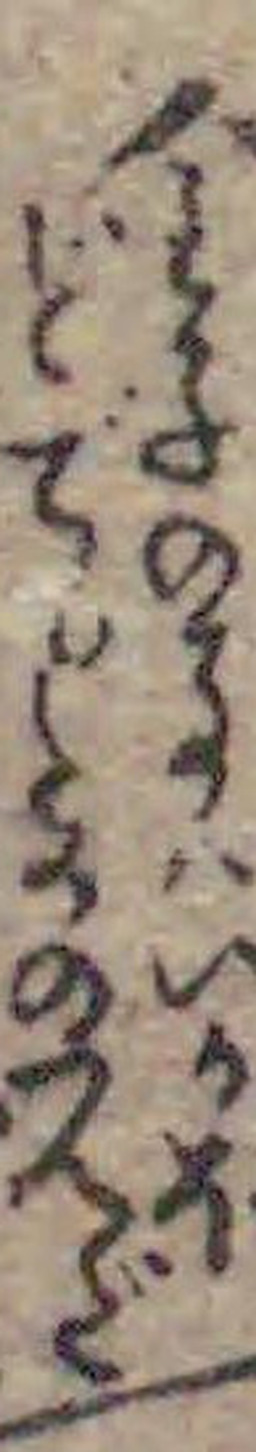どでもとかのつんだ
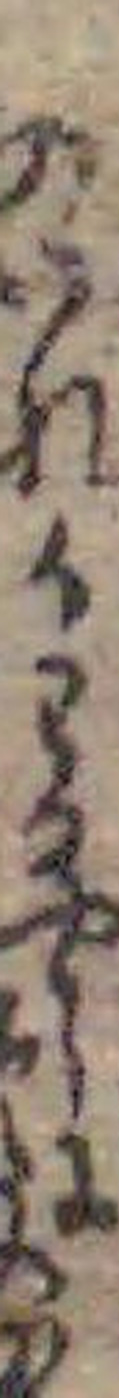のいれかわるやうに
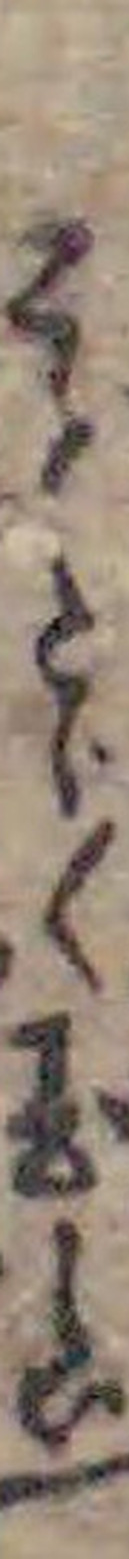こととかく玉しい

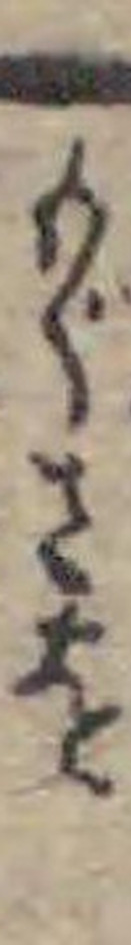もぐさを
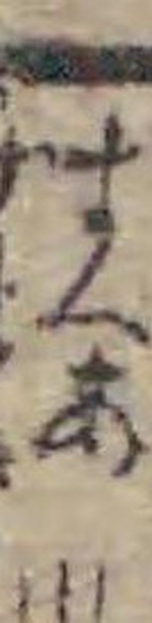すへあ
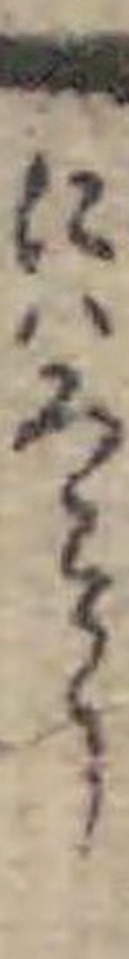にはろこう
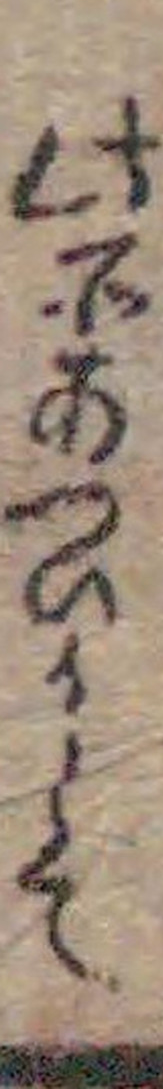此所あついかとて
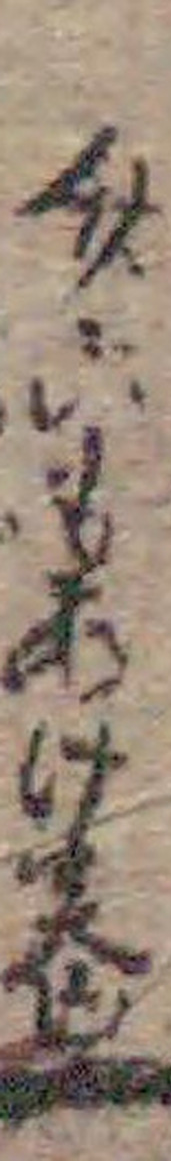介六もあけ巻
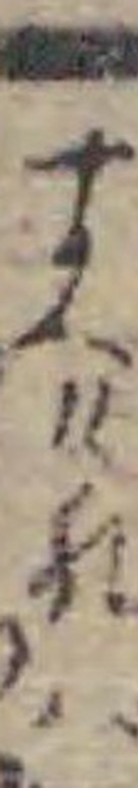すへければ
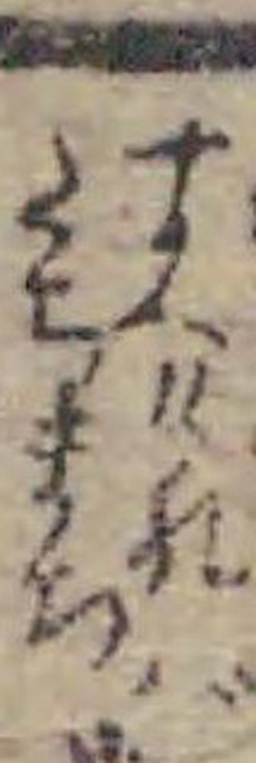たちまち
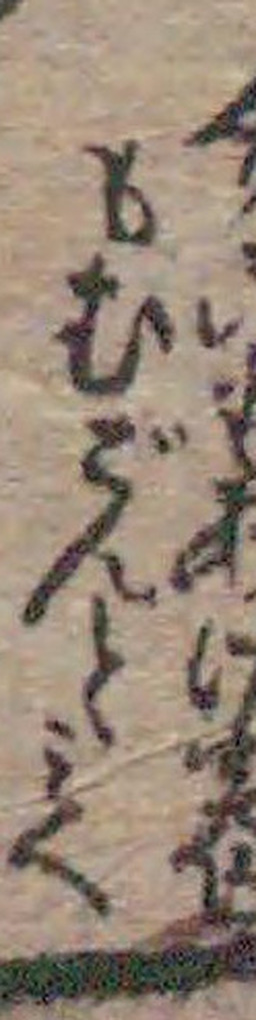もむごんとみへ
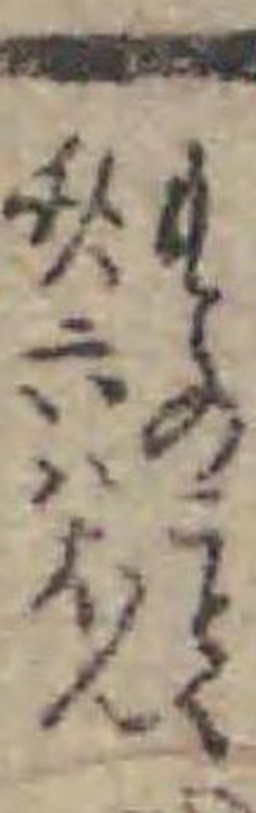介六はほん
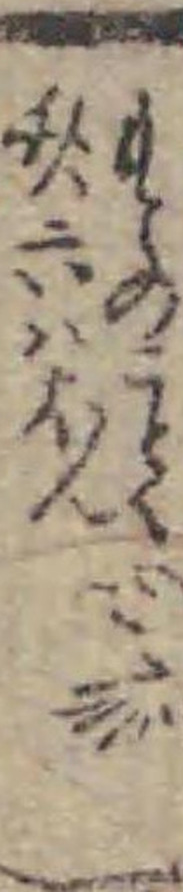介六はほん
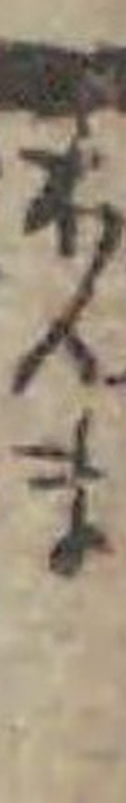ほんま
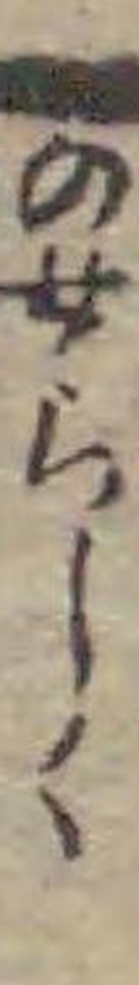の女らしく
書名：江戸花俳優贔屓 : 3巻
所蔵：国立国会図書館 National Diet Library, JAPAN
